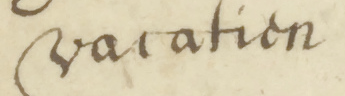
vacatien
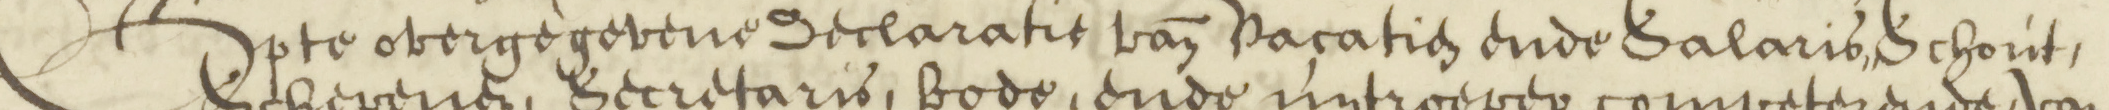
Opte overgegevene Declaratie van Vacatien ende Salaris„van Schout,
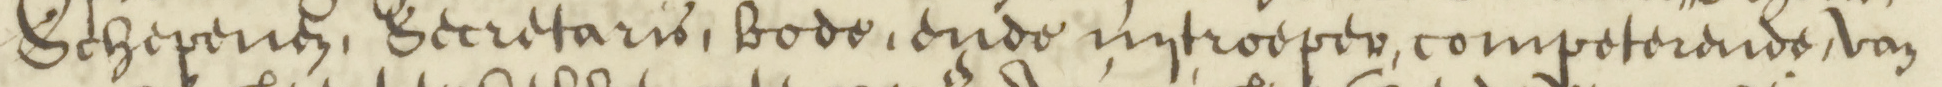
Schepenen, Secretaris, bode, ende uytroeper, competerende, van
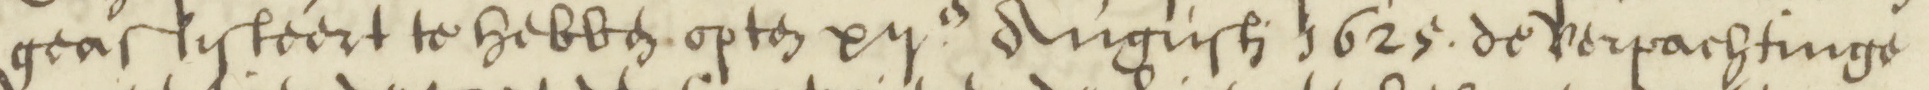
geassisteert te hebben opten xijen. Augusti 1625. de verpachtinge
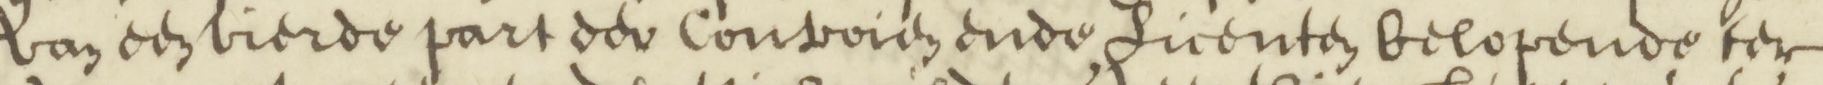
van een vierde part der Convoien ende Licenten belopende ter
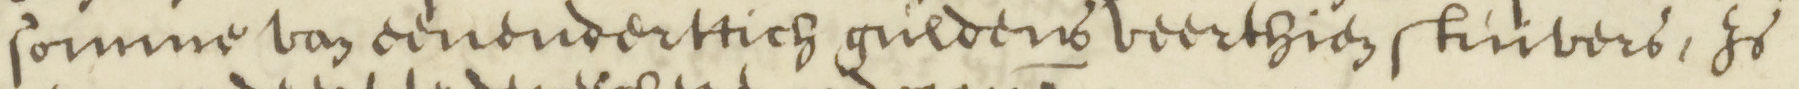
somme van eenenderttich guldens veerthien stuivers, Is
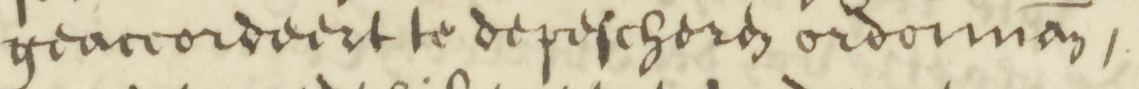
geaccordeert te depescheren ordonnan,
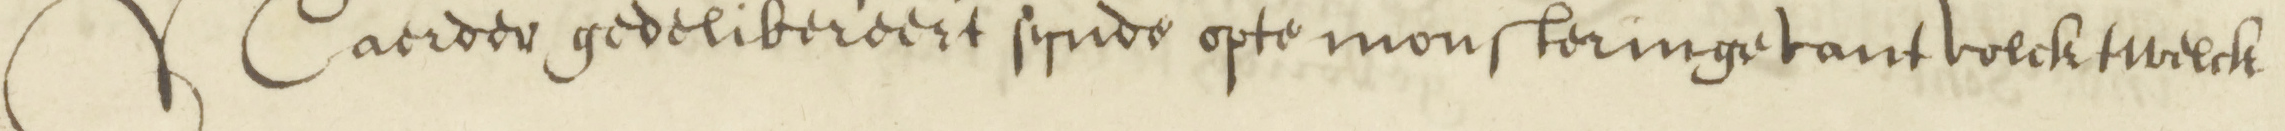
Naerder gedelibereert synde opte monsteringe vant volck twelck
